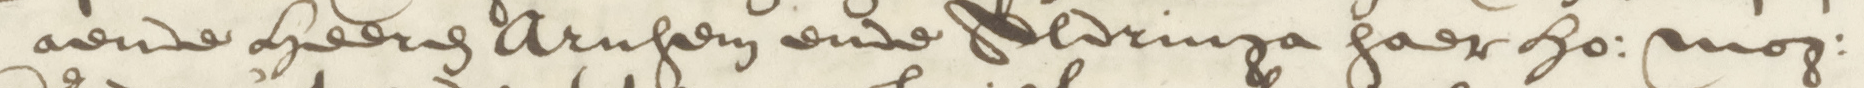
aende heeren Arnhem ende Aldringa haer Ho:Mo:
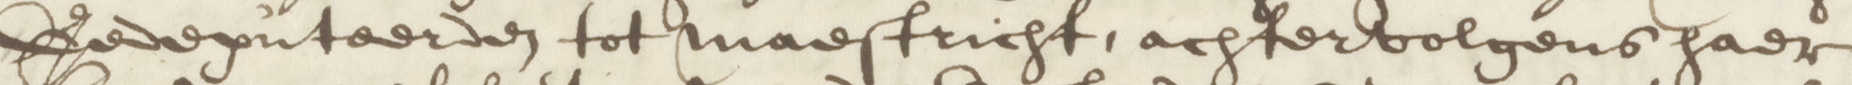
Gedeputeerden tot Maestricht, achtervolgens haer
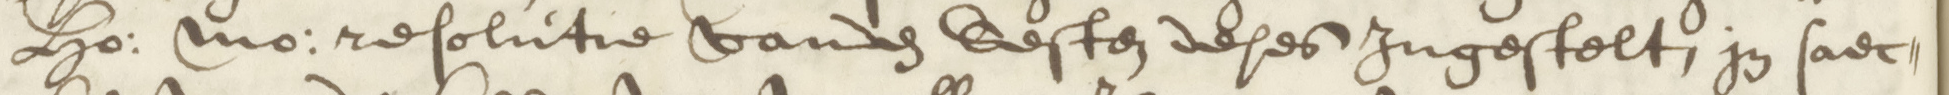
Ho:Mo: resolutie vanden Sesten deses Ingestelt, in saec„
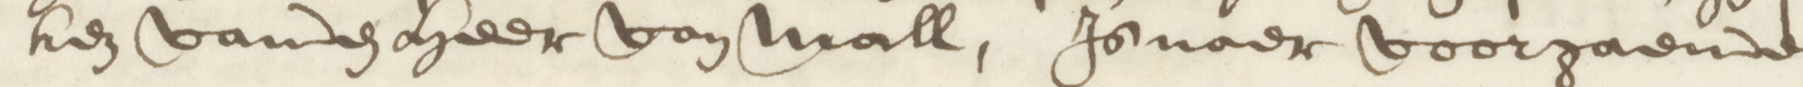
ken vanden heer van Mall, Is naer voorgaende —
